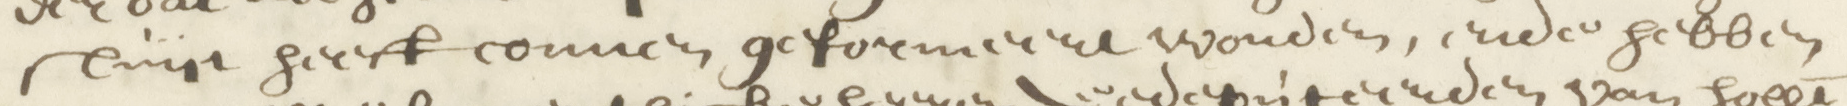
sluijt heeft connen geformeert worden, ende hebben
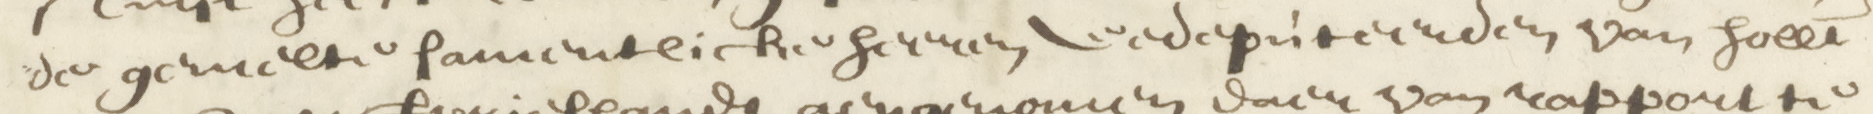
de gemelte samentlicke heeren Gedeputeerden van hollt
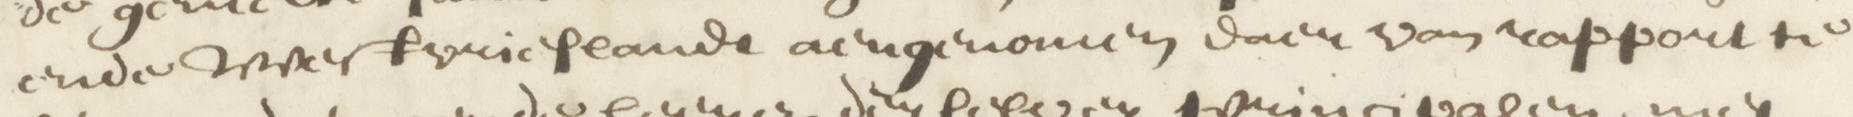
ende Westvrieslandt aengenomen daer van rapport te
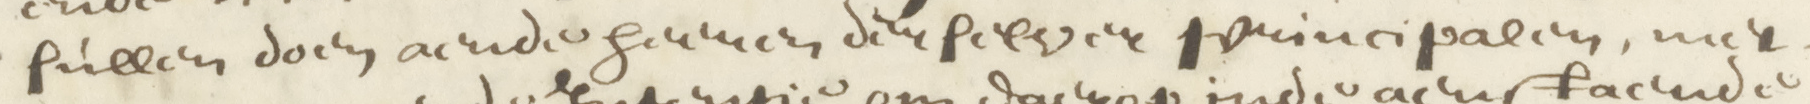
sullen doen aende heeren derselver principalen, met
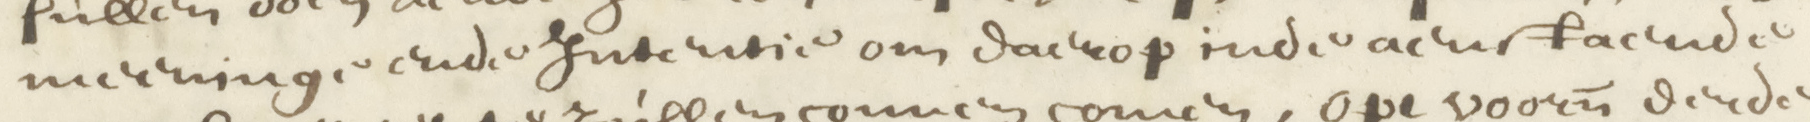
meeninge ende Intentie om daerop inde aenstaende
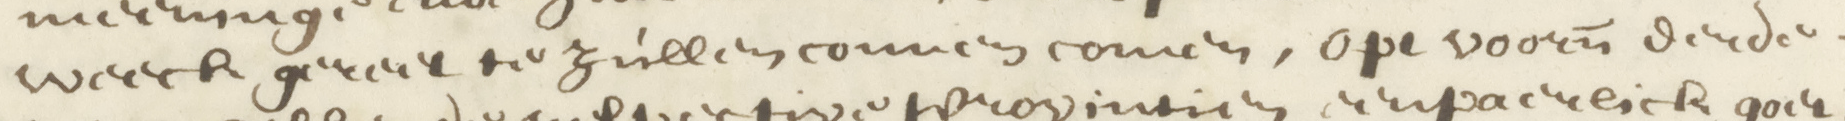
weeck gereet te zullen connen comen, opt voorn derde
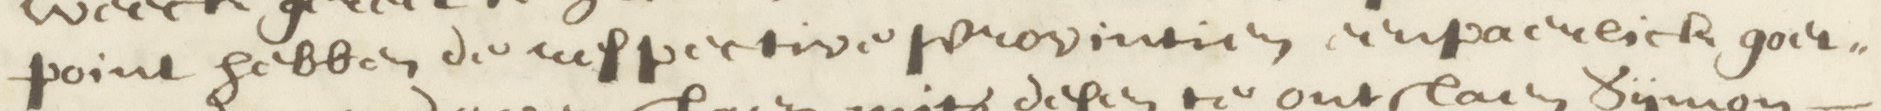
point hebben de respective provintien eenpaerlick goet,,
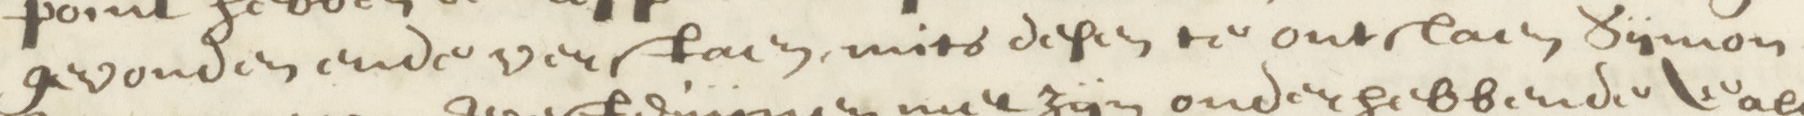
gevonden ende verstaen, mits desen te ontslaen Symon
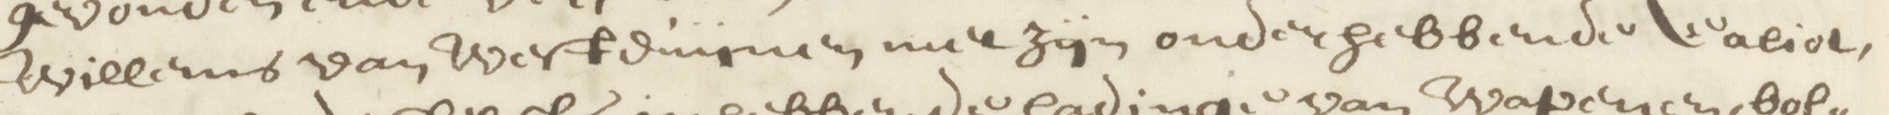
Willems van Westduijnen met zijn onderhebbende Galiot
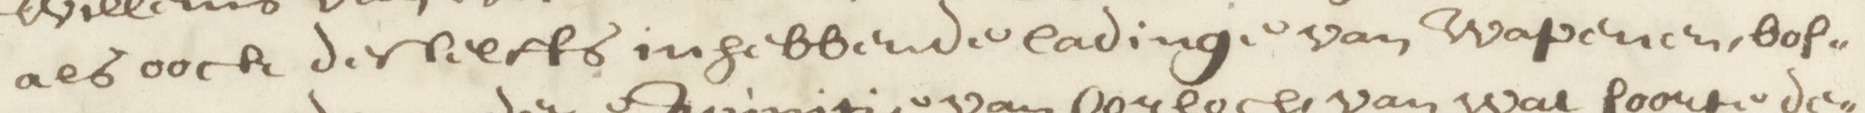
als oock desselffs inhebbende ladinge van wapenen, bos,,
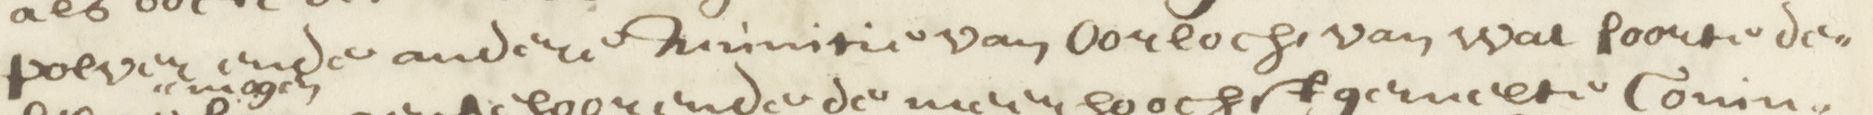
polver ende andere munitie van oorloch van wat soorte de,,
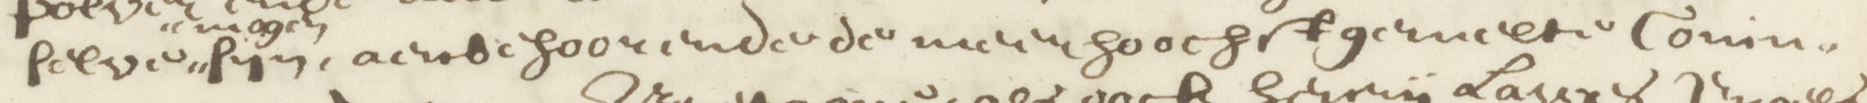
selve mogen sijn, aenbehoorende de meerhoochstgemelte Conin,,
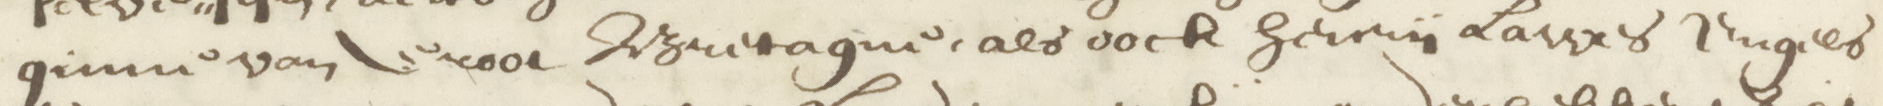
ginne van Groot Bretagne, als oock henrij Lawes Engels
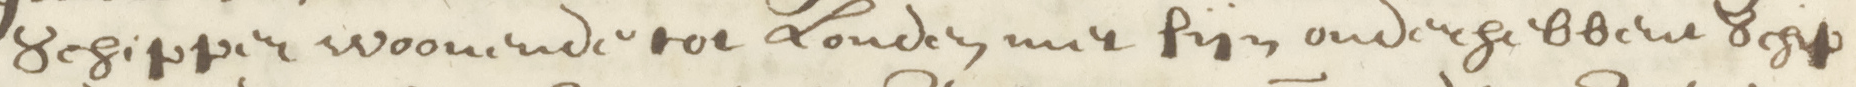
schipper woonende tot Londen met sijn onderhebbene schip
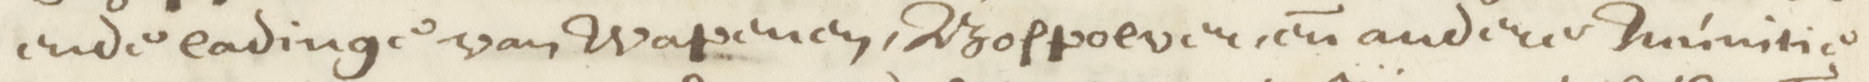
ende ladinge van wapenen, Bospolver, en andere munitie
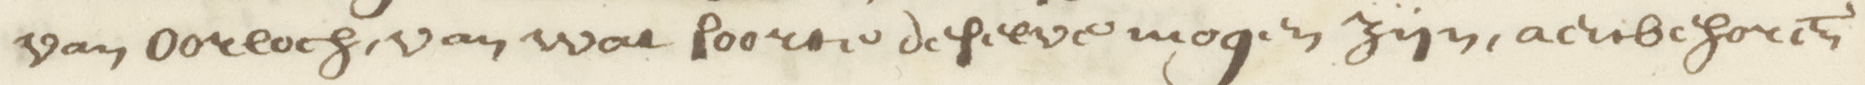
van oorloch, van wat soorte deselve mogen zijn, aenbehoren
